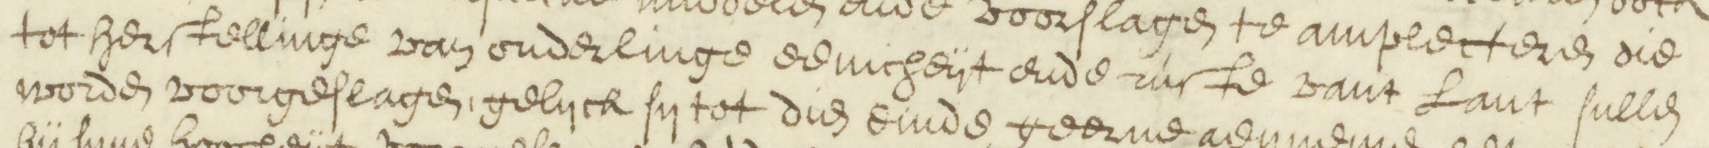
tot herstellinge van onderlinge eenicheijt ende ruste vant Lant sullen
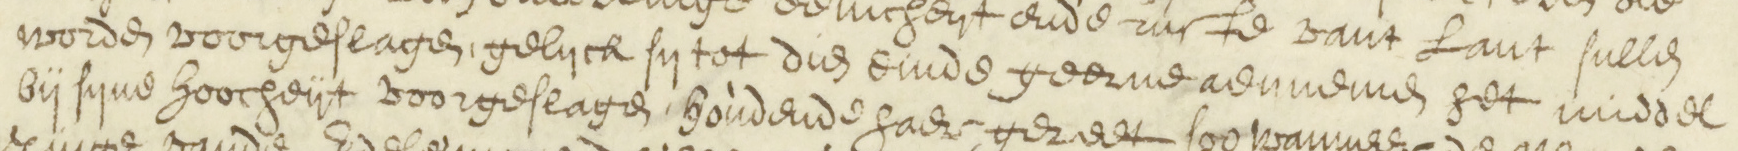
worden voorgeslagen, gelyck sy tot dien einde geerne aennemen het middel
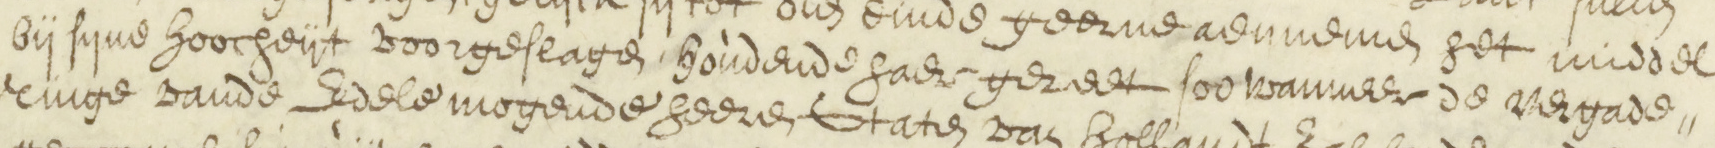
bij syne hoocheijt voorgeslagen, houdende haer gereet soo wanneer de Vergade„
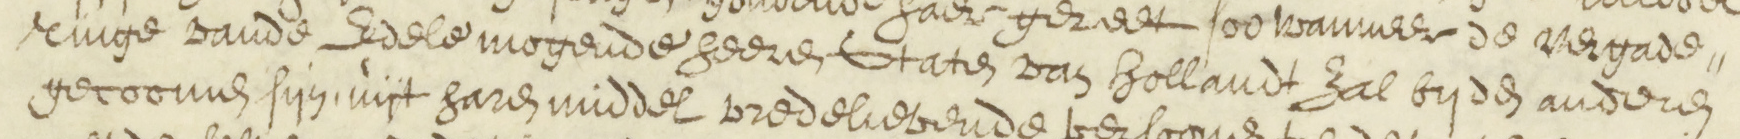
ringe vande Edele mogende heeren Staten van Hollandt zal by den anderen
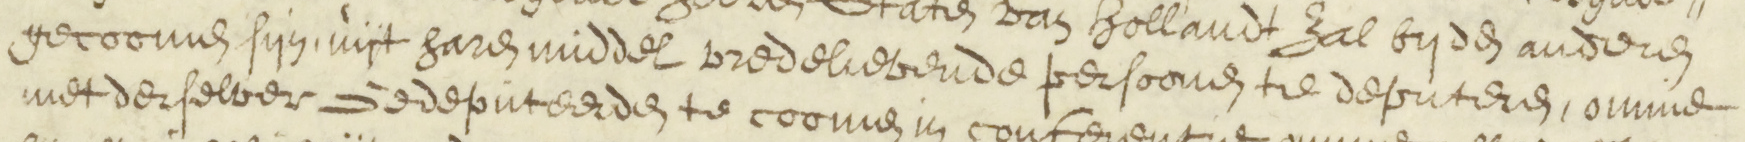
gecoomen sijn, uijt haren middel vredelievende persoonen te deputeren, omme
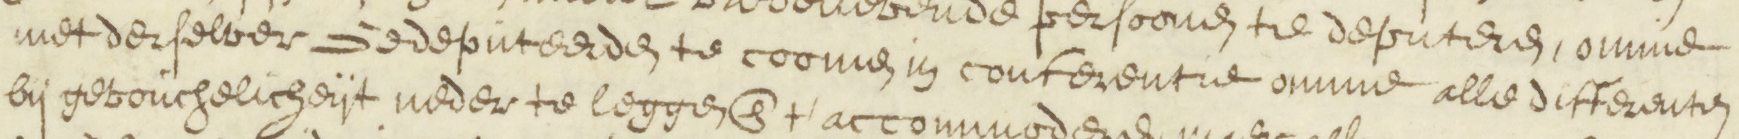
met derselver Gedeputeerden te coomen in conferentie omme alle differenten
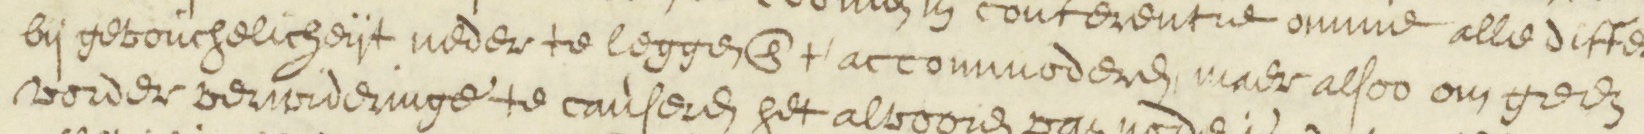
bij gevouchelicheijt neder te leggen & t'accommoderen, maer alsoo om geen
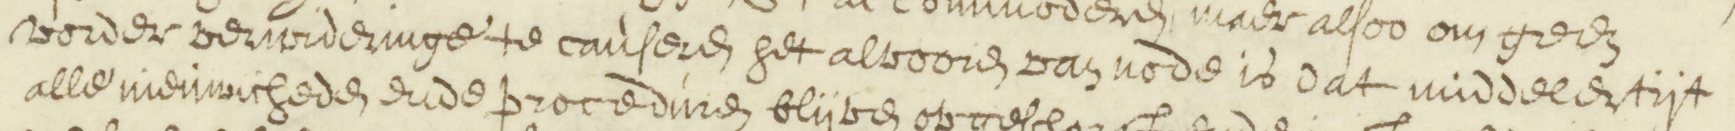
vorder verwideringe te causeren het alvooren van node is dat middelertijt
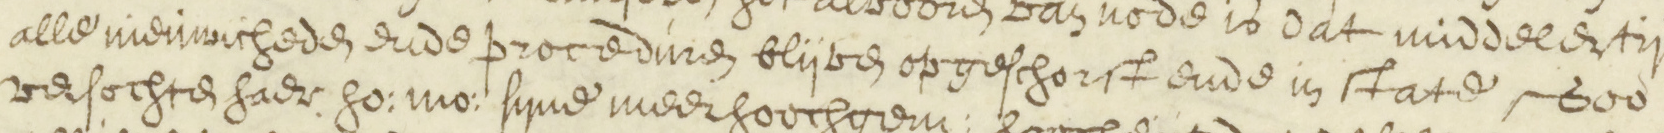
alle nieuwicheden ende proceduren blijven opgeschorst ende in state, soo
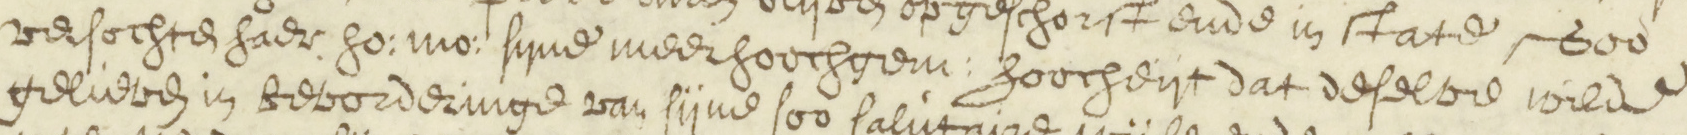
versochten haer ho:mo: sijne meerhoochgem: hoocheijt dat deselve wilde
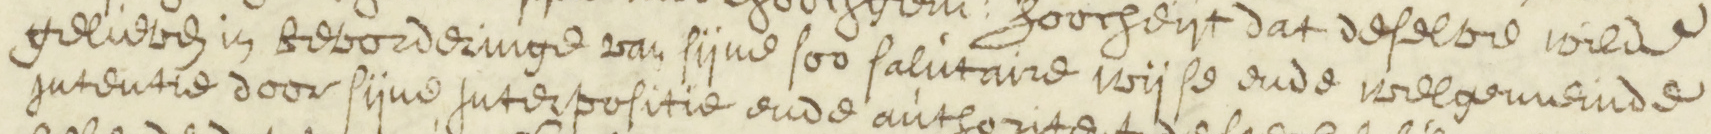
gelieven in bevorderinge van sijne soo salutaire wijse ende welgemeinde
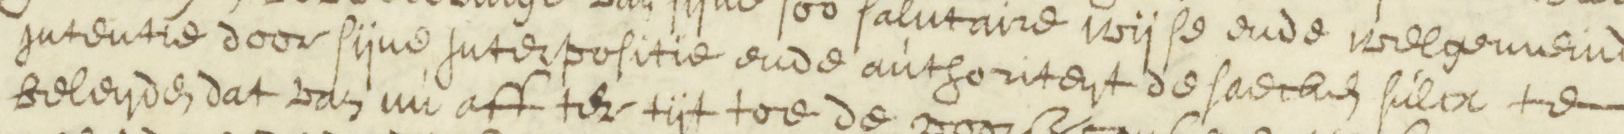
Intentie door sijne Interpositie ende authoriteyt de saecken sulcx te
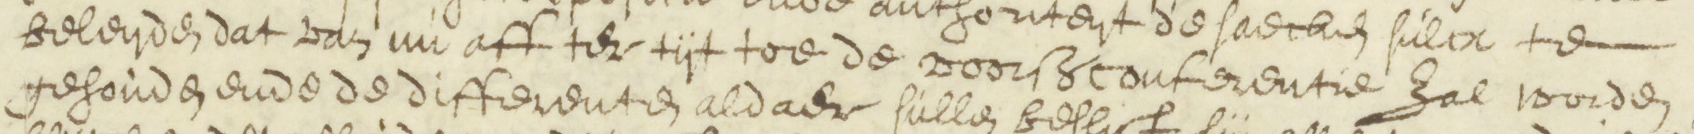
beleyden dat van nu aff ter tijt toe de voors conferentie zal worden
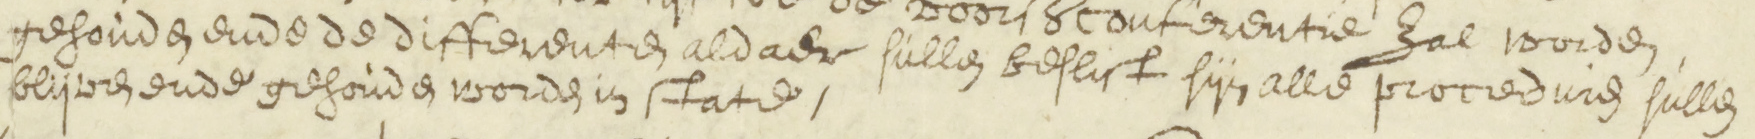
gehouden ende de differenten aldaer sullen beslist sijn alle proceduren sullen
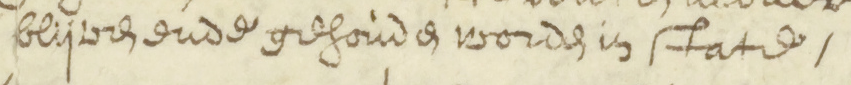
blijven ende gehouden worden in state.
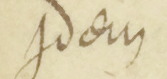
Idem
